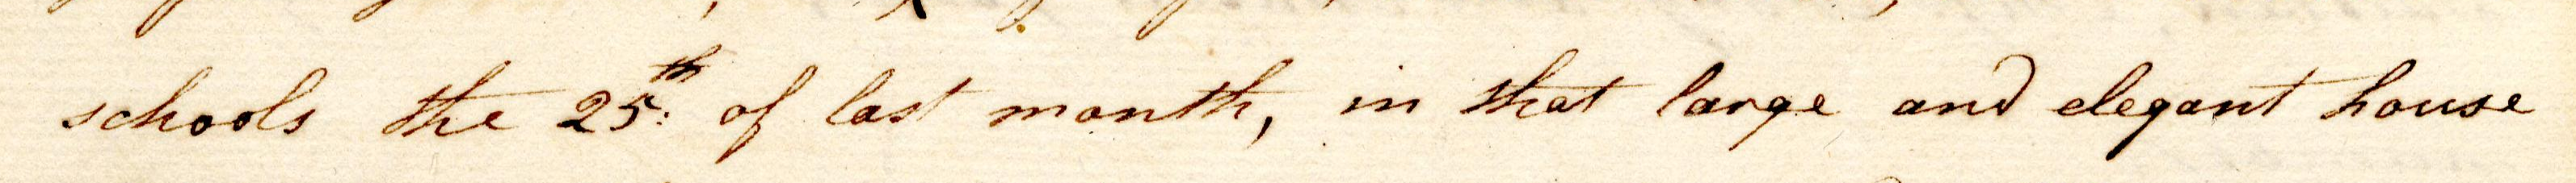schools the 25^th. of last month, in that large and elegant house
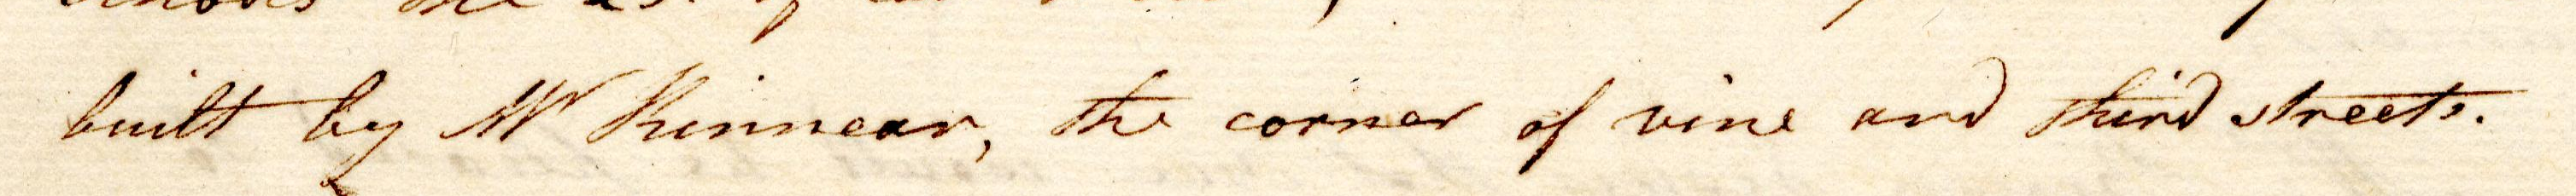built by M^r Rinnear, the corner of vine and third streets.
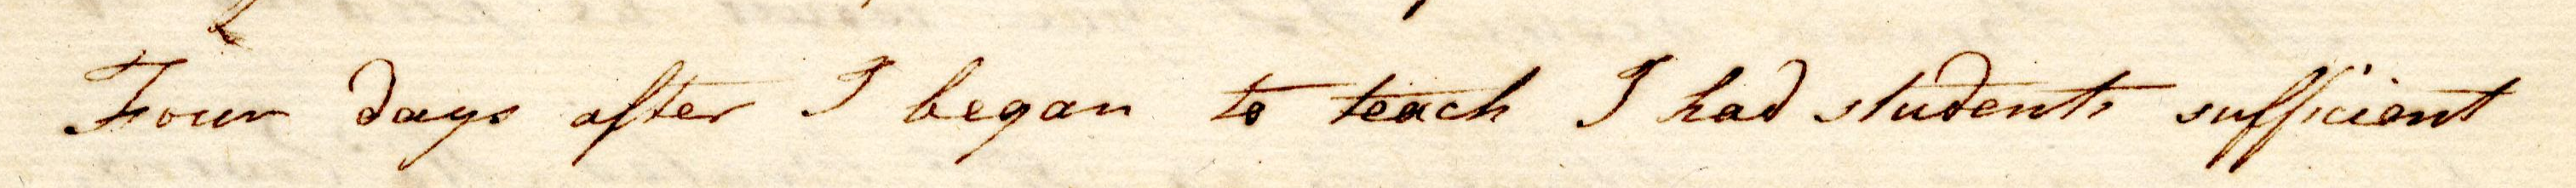Four days after I began to teach I had students sufficient
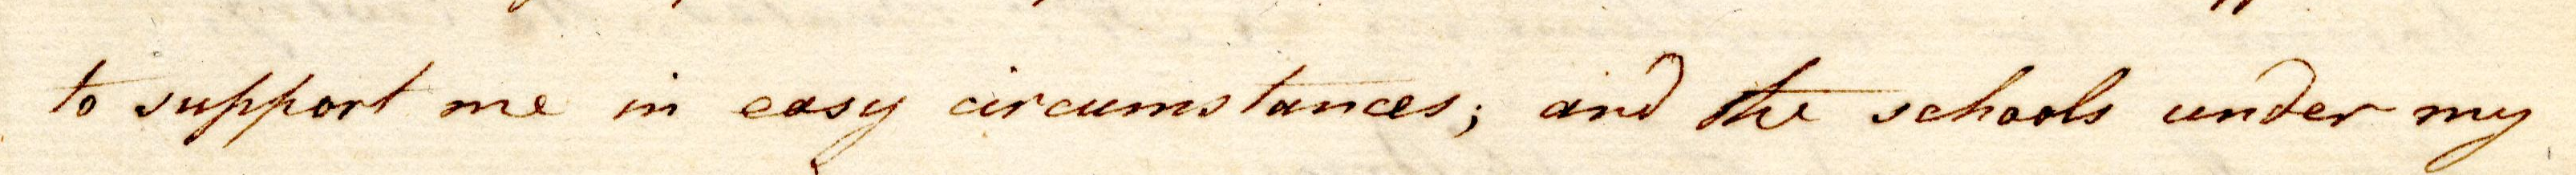to support me in easy circumstances; and the schools under my
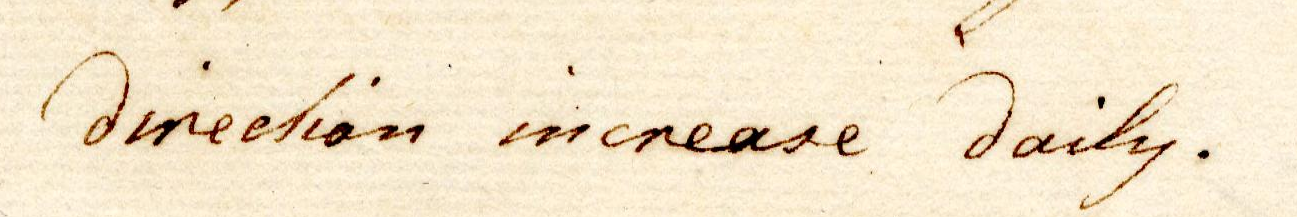direction increase daily.
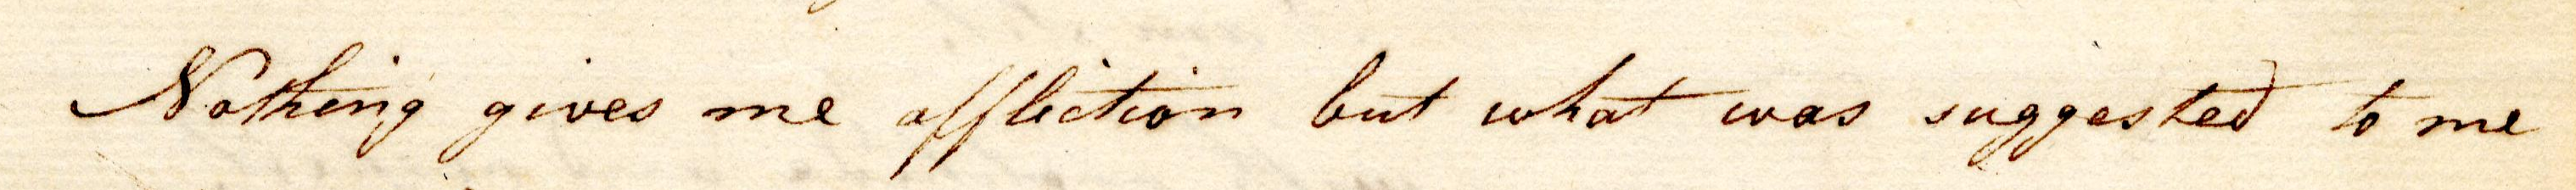Nothing gives me affliction but what was suggested to me
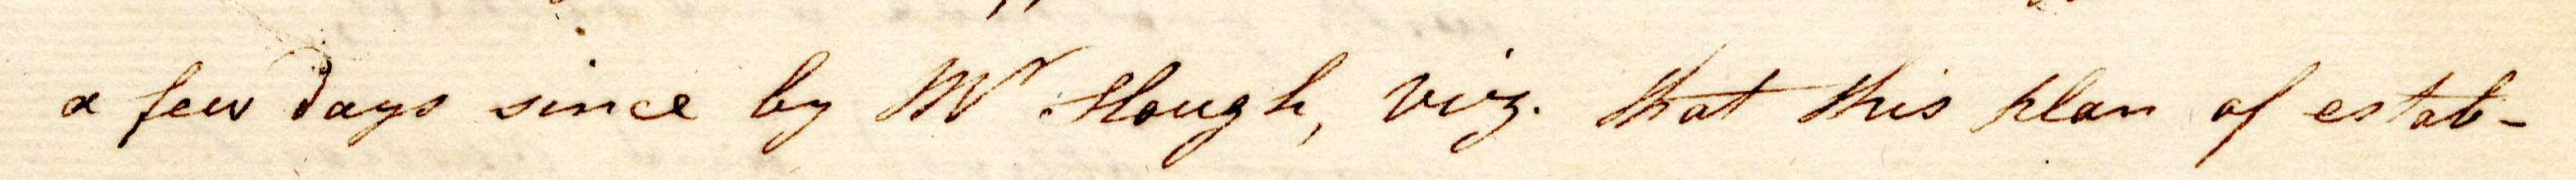a few days since by M^r Slough, viz. that this plan of estab-
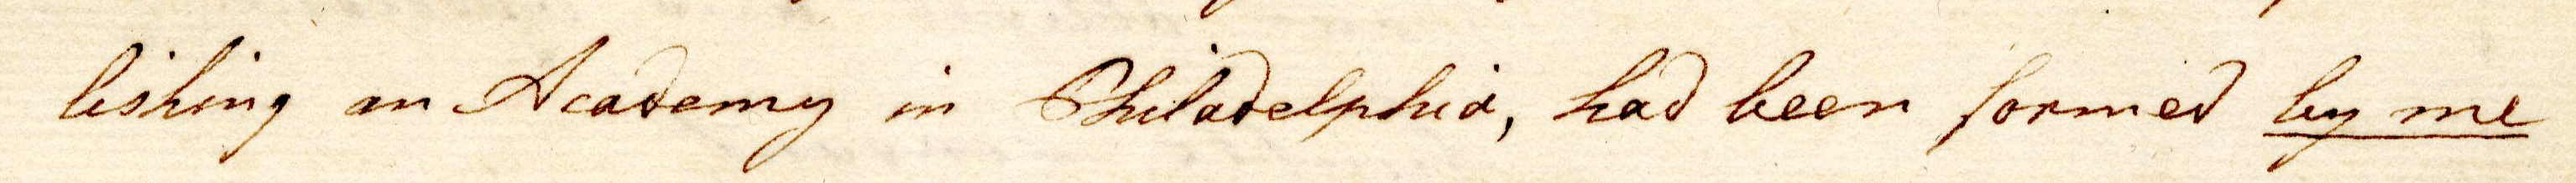-lishing an Academy in Philadelphia, had been formed by me
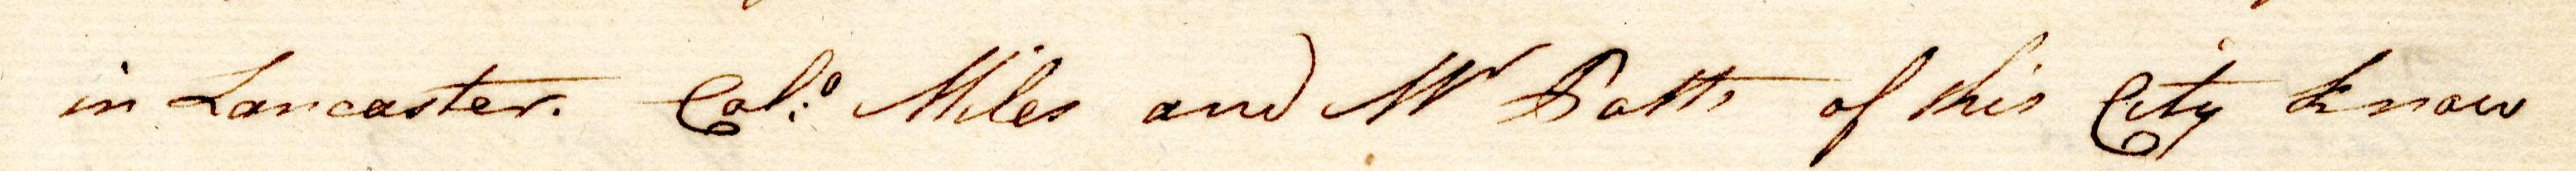in Lancaster. Col^o. Miles and M^r Potts of this City know
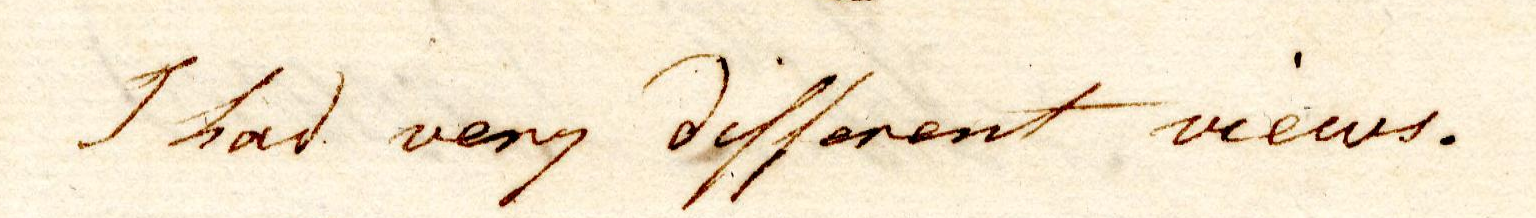I had very different views.
